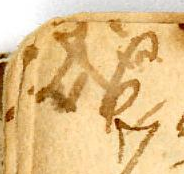46
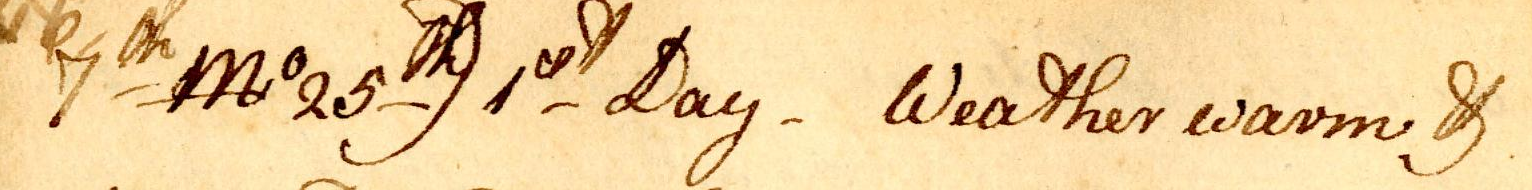7^th M^o 25^th) 1^st Day- Weather warm &
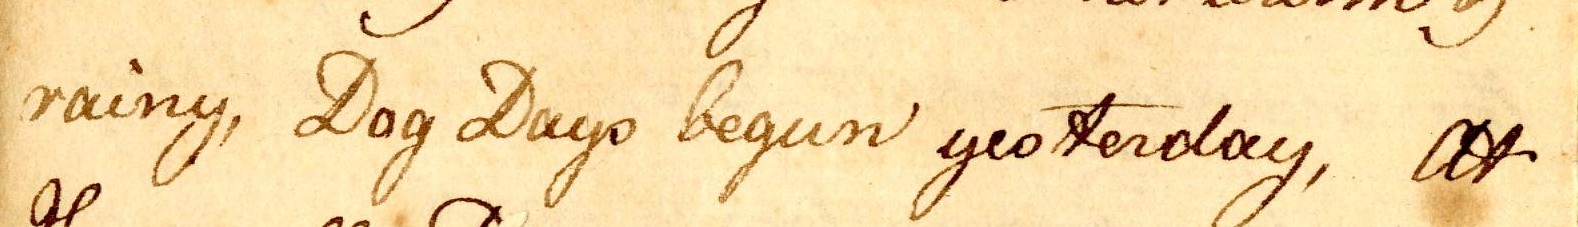rainy, Dog Days begun yesterday, At
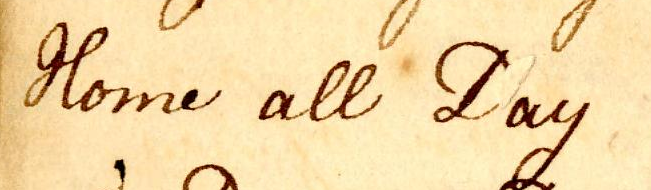Home all Day
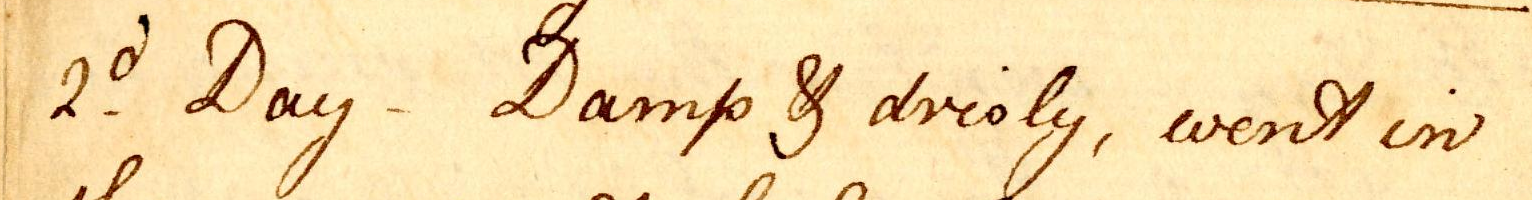2^d Day- Damp & drisly, went in
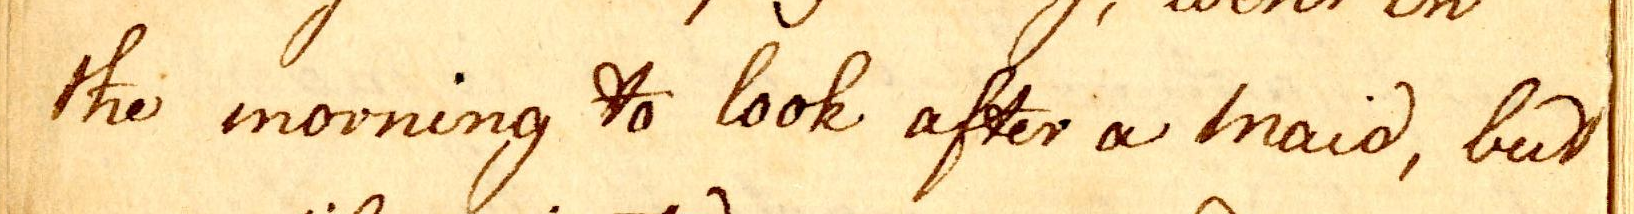the morning to look after a maid, but
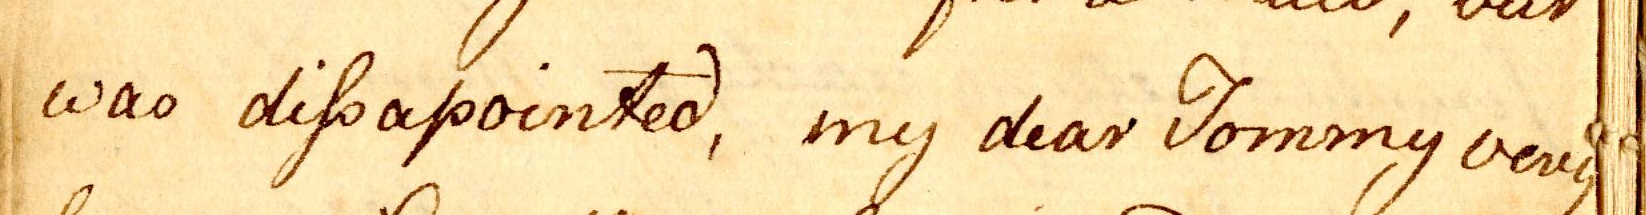was dissapointed, my dear Tommy very
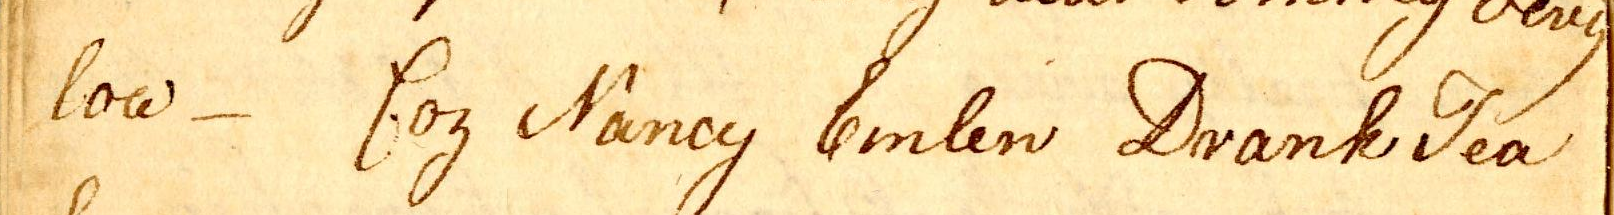low- Coz Nancy Emlen Drank Tea
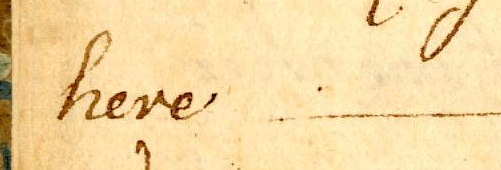here-
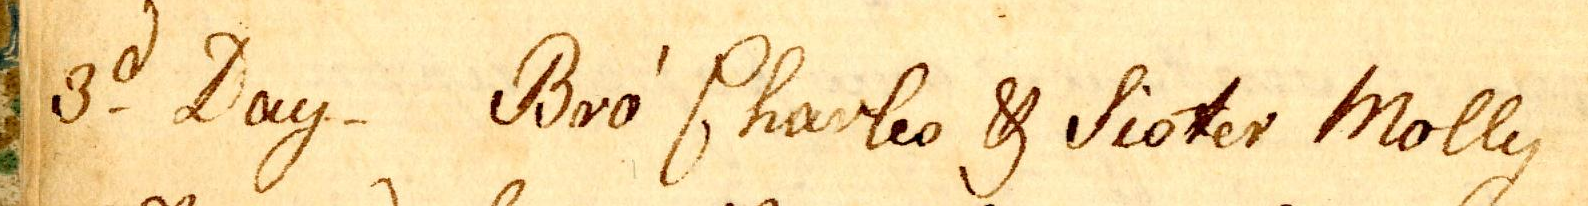3^d Day- Bro' Charles & Sister Molly
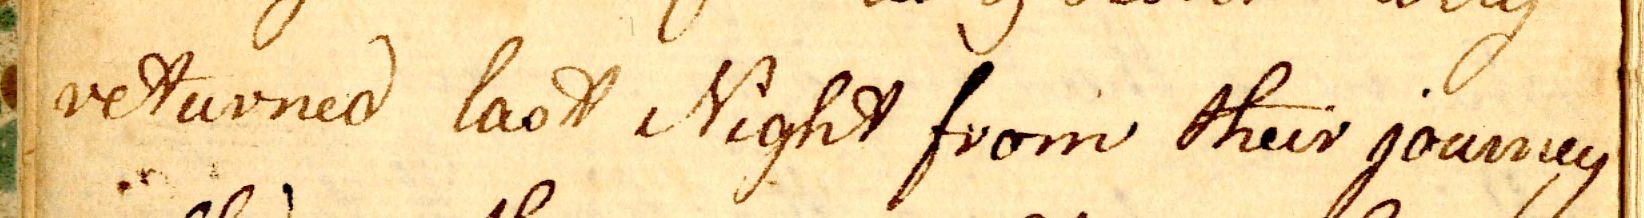returned last Night from their journey
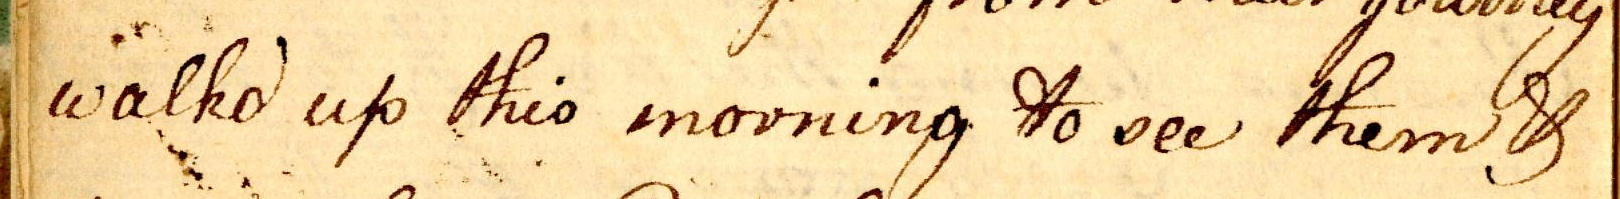walkd up this morning to see them &
